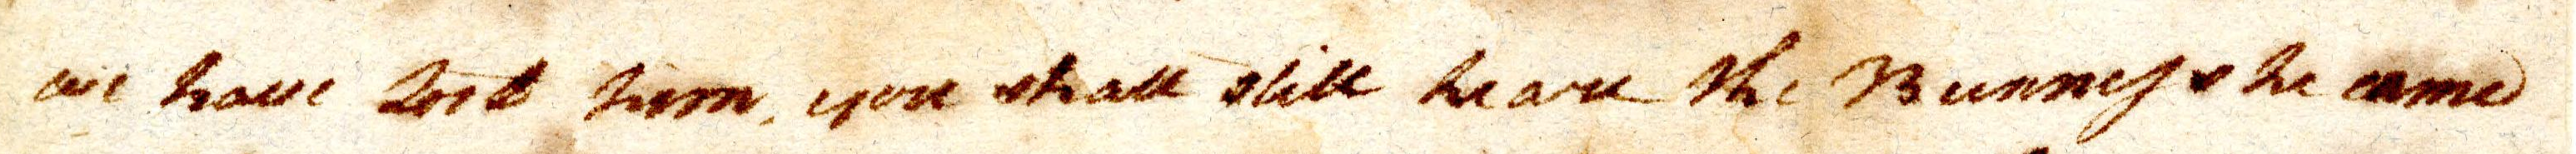we have Lost him you shall still hear the Business he came
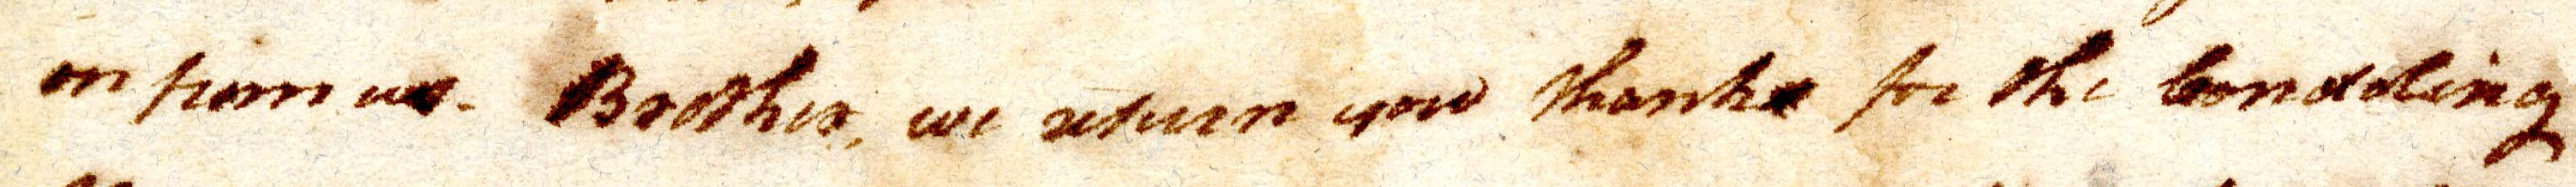on from us. Brother, we return you thanks for the Condoling
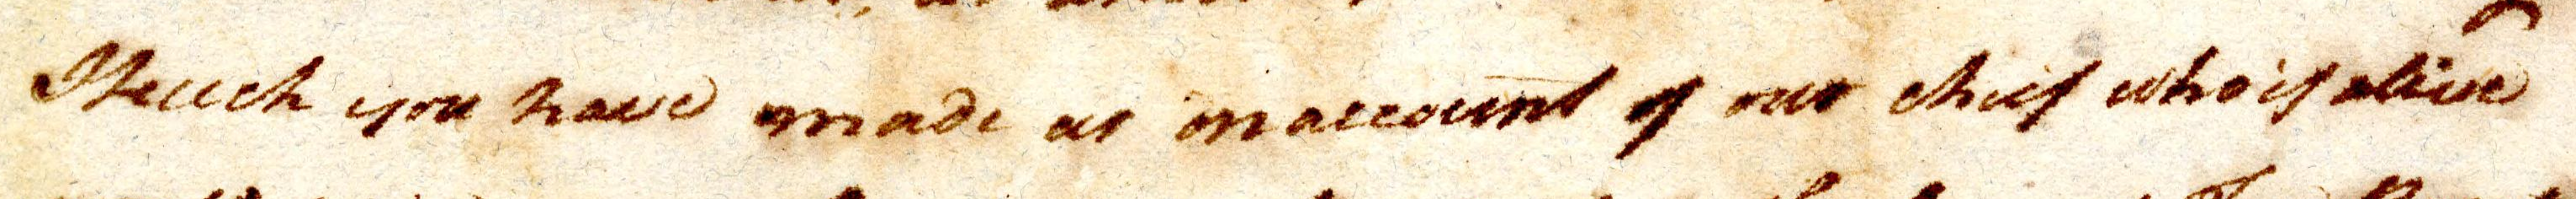speech you have made as on account of our chief who if alive
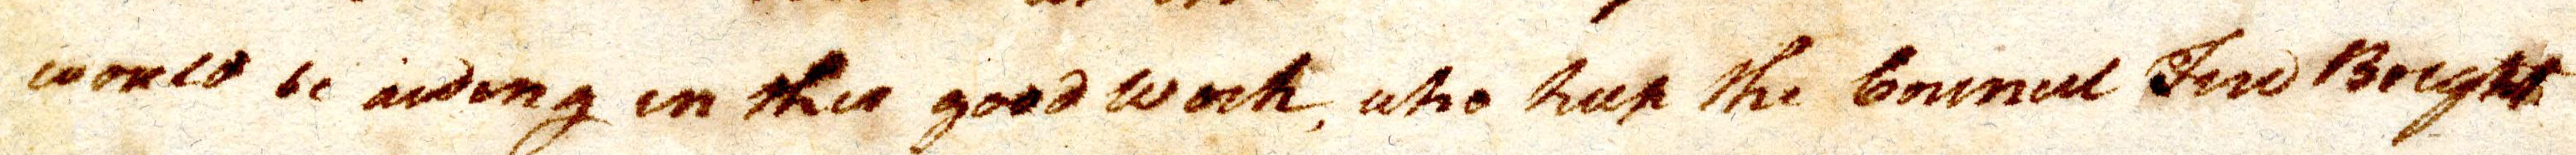would be aiding in this good work, who keep the Council Fire Bright
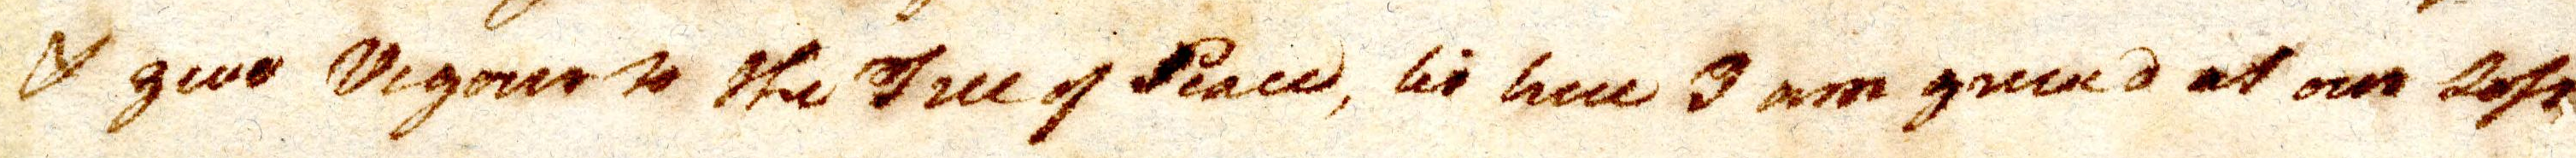& give Vigour to the Tree of Peace, tis here I am grieved at our Loss
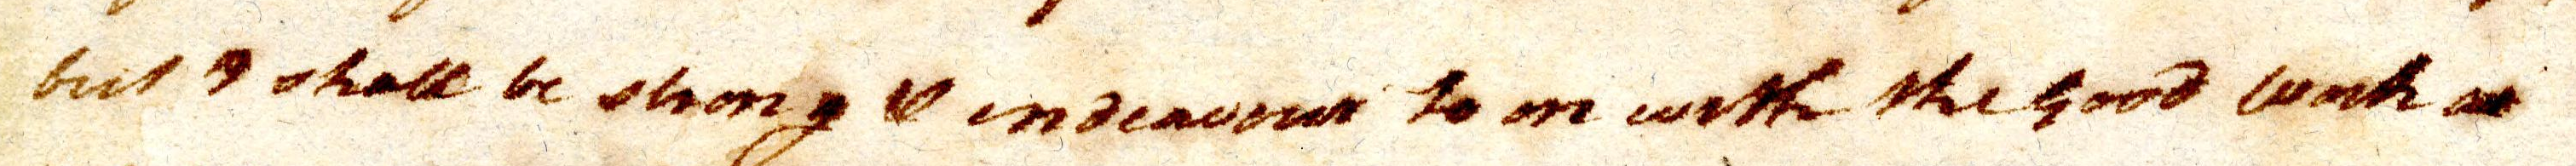but I shall be strong & endeavour to on with the Good work as
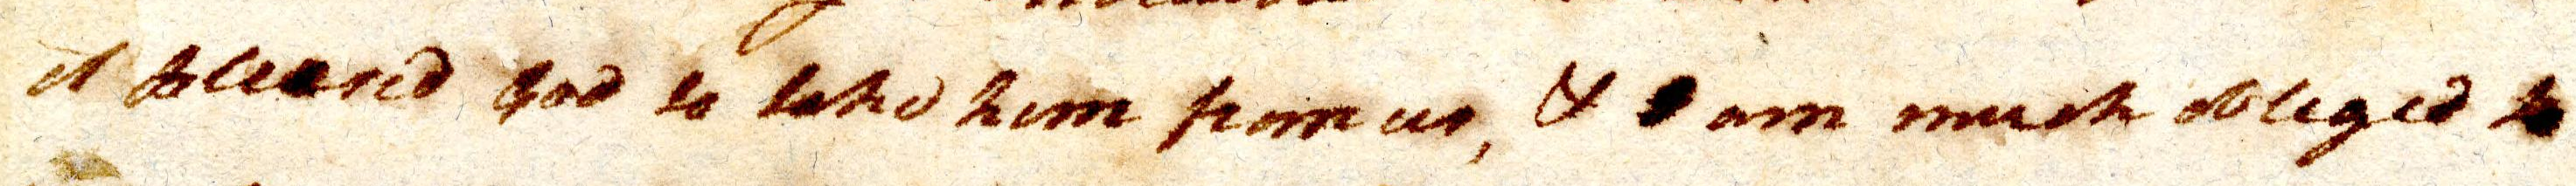it pleased God to take him from us, & I am much obliged to
